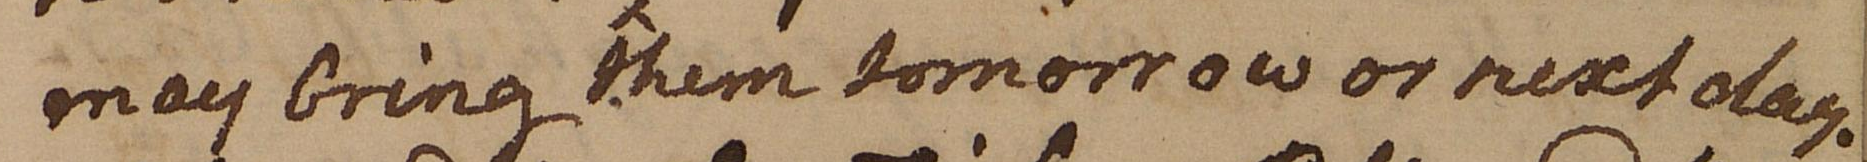may bring them tomorrow or next day.
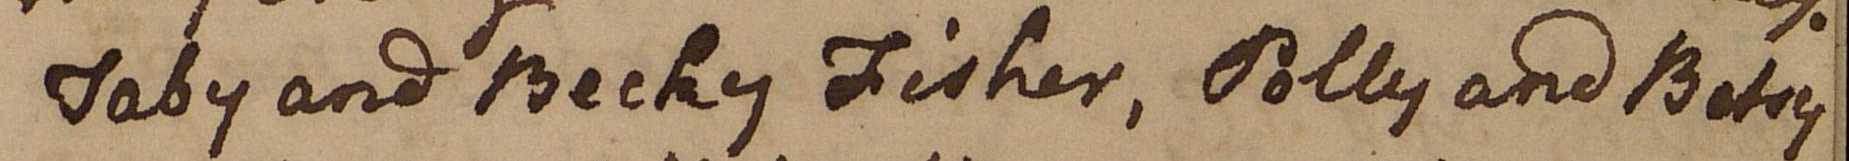Taby and Becky Fisher, Polly and Betsy
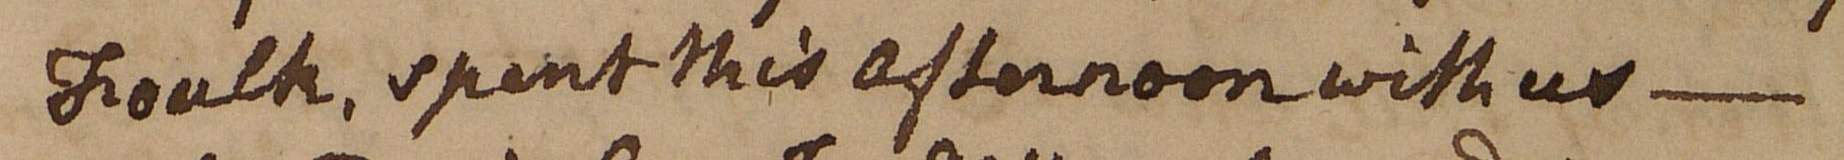Foulk, spent this afternoon with us-
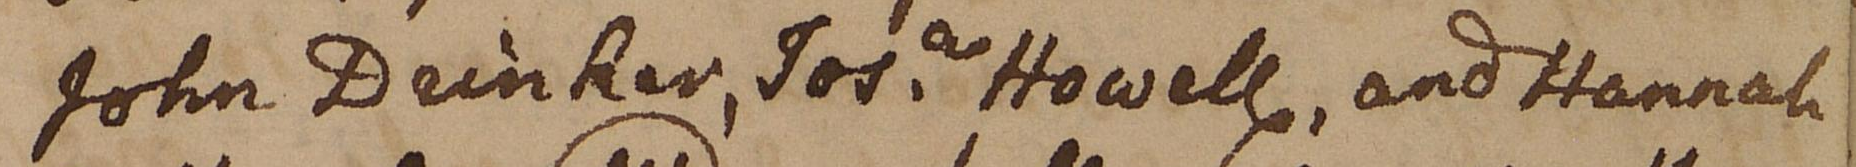John Drinker, Jos^a. Howell, and Hannah
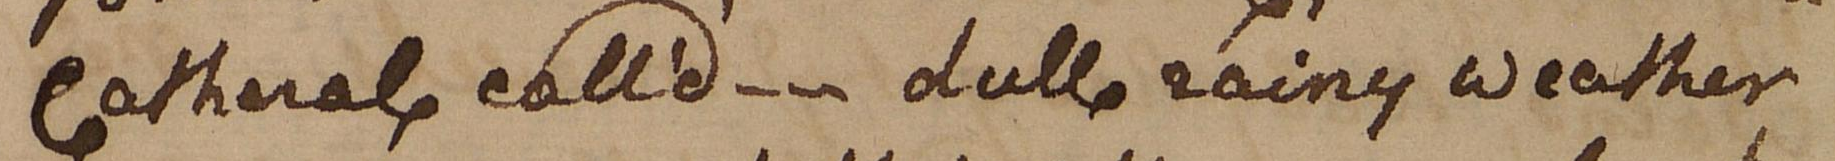Catherall call'd- dull rainy weather
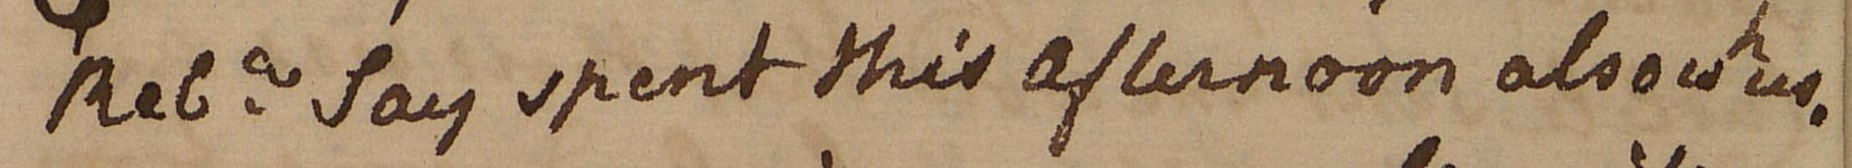Reb^a. Say spent this afternoon also w^h us.
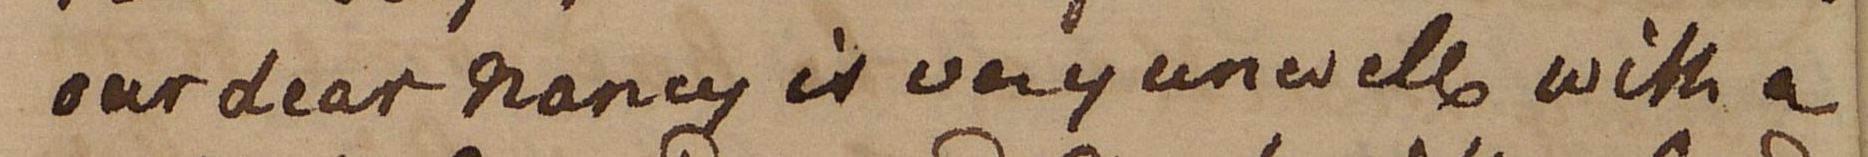our dear Nancy is very unwell with a
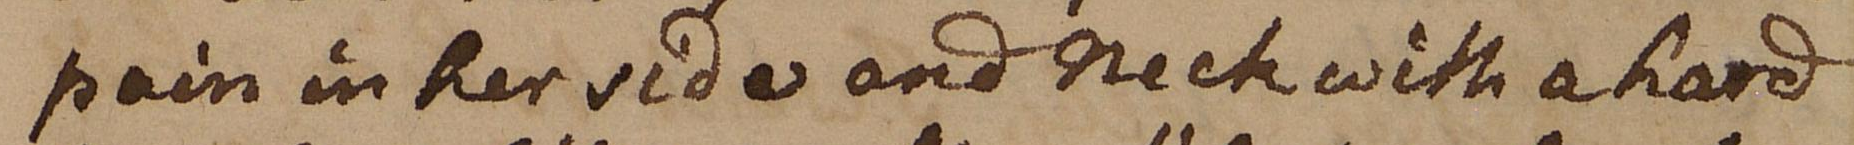pain in her side and Neck with a hard
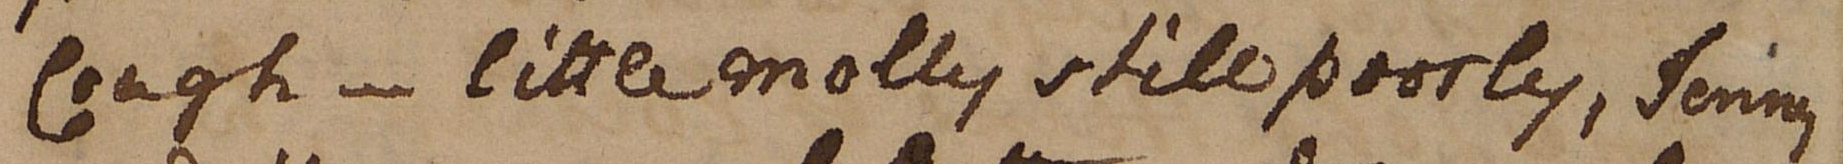Cough- little Molly still poorly, Jenny
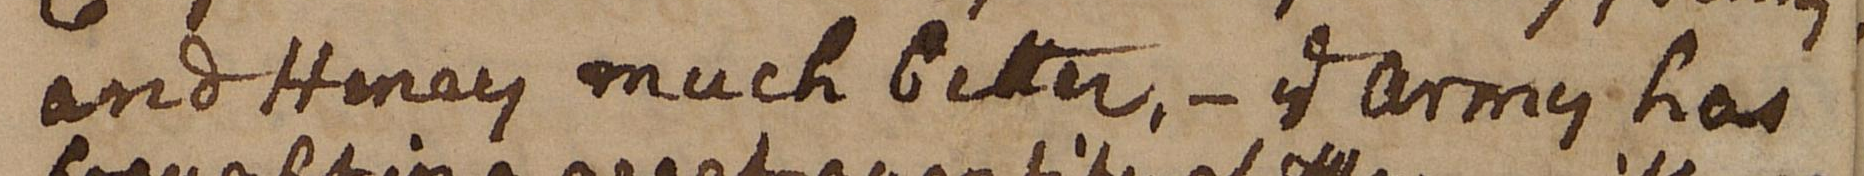and Henry much better,- y^e army has
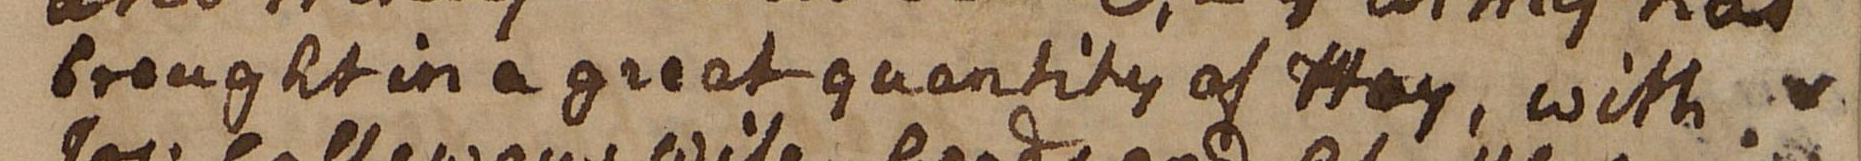brought in a great quantity of Hay, with
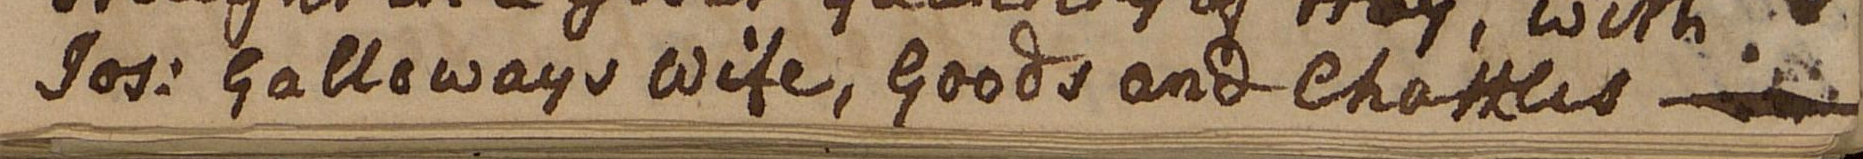Jos: Galloways Wife, Goods and Chattles
